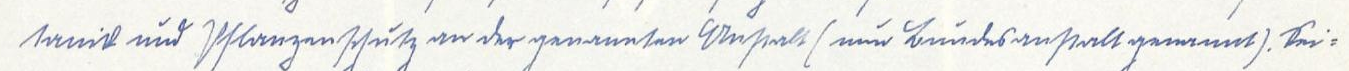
tanik und Pflanzenschutz an der genannten Anstalt (nun Bundesanstalt genannt). Sei-
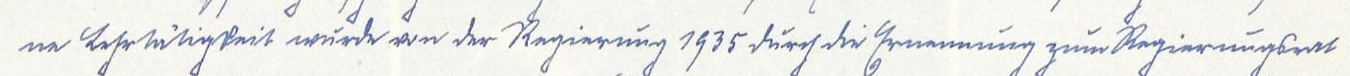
ne Lehrtätigkeit wurde von der Regierung 1935 durch die Ernennung zum Regierungsrat
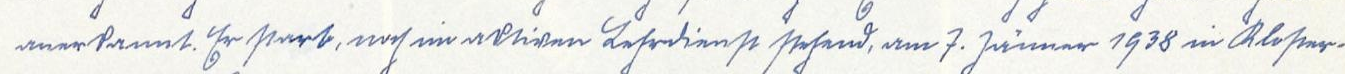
anerkannt. Er starb, noch im aktiven Lehrdienst stehend, am 7. Jänner 1938 in Kloster-
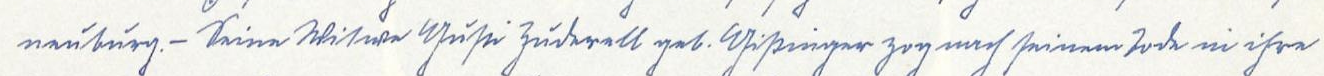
neuburg.-Seine Witwe Gusti Zuderell geb. Gißinger zog nach seinem Tode in ihre
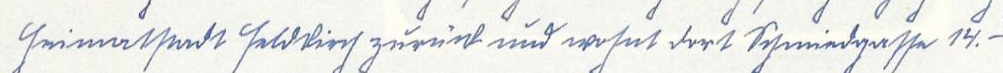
Heimatstadt Feldkirch zurück und wohnt dort. Schmidgasse 14.-
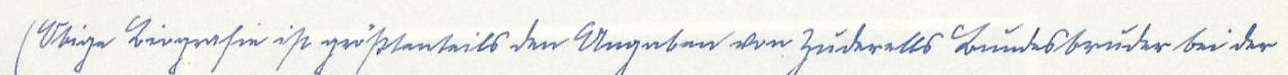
(Obige Biografie ist größtenteils den Angaben von Zuderells Bundesbruder bei der
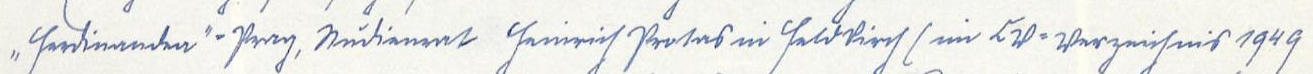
„Ferdinandea“ Prag, Studienrat Heinrich Protas in Feldkirch (im CV-Verzeichnis 1949
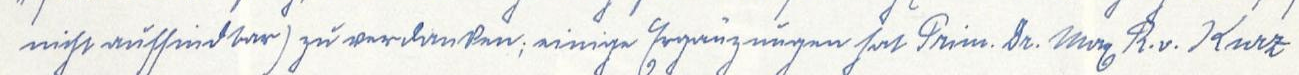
nicht auffindbar) zu verdanken; einige Ergänzungen hat Prim. Dr. Max R. v. Kurz
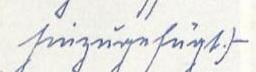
hinzugefügt.)
